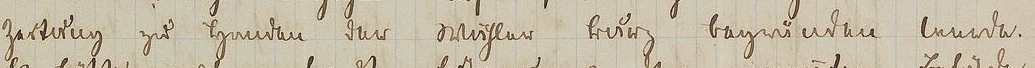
Zeitung zu Handen der Wähler kurz begründen werde.
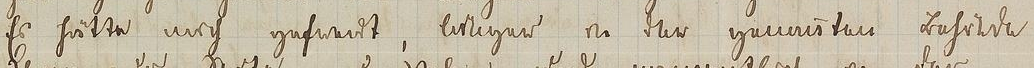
Es hätte mich gefreut, länger in der genannten Behörde
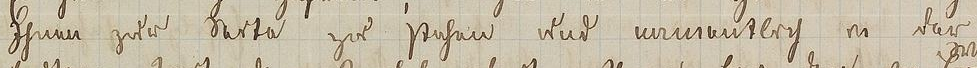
Ihnen zur Seite zu stehen und namentlich in der
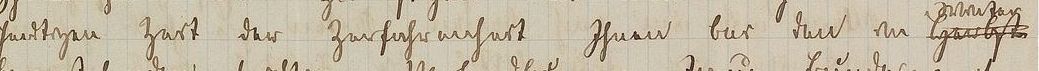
heutigen Zeit der Zerfahrenheit Ihnen bei den im HerbstWinter
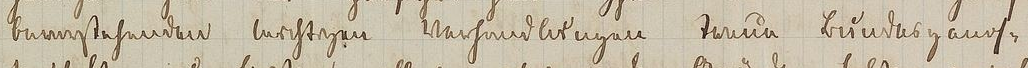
bevorstehenden wichtigen Verhandlungen treue Bundesgenos-
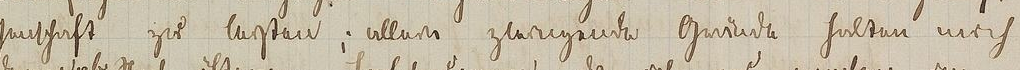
senschaft zu leisten; allein zwingende Gründe halten mich
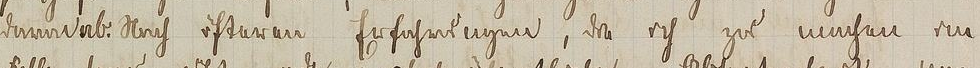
davon ab. Nach öfteren Erfahrungen, die ich zu machen im
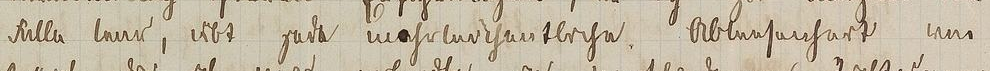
Falle war, übt jede mehrwöchentliche Abwesenheit von
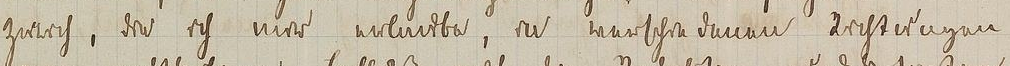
Zürich, die ich mir erlaube, in verschiedenen Richtungen
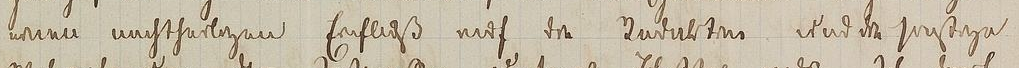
einen nachtheiligen Einfluß auf die Redaktion und die sonstige
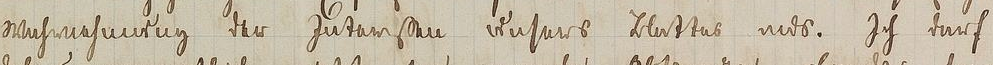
Wahrnehmung der Intereßen unsers Blattes aus. Ich darf
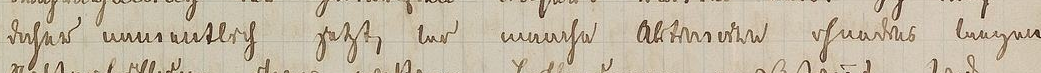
daher namentlich jetzt, wo manche Aktionäre ohnedies wegen
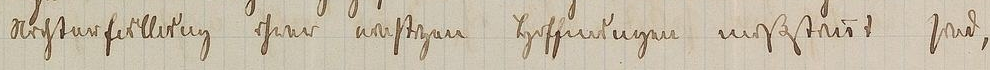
Nichterfüllung ihrer einstigen Hoffnungen mißgestimmt sind,
